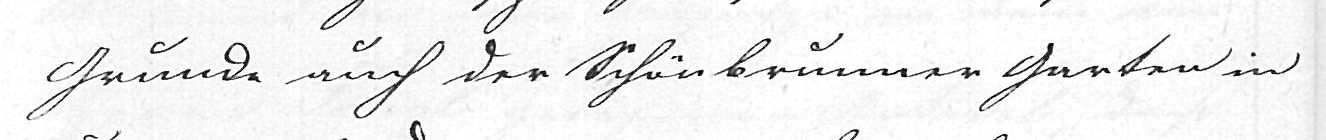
Grunde auch der Schönbrunner Garten in
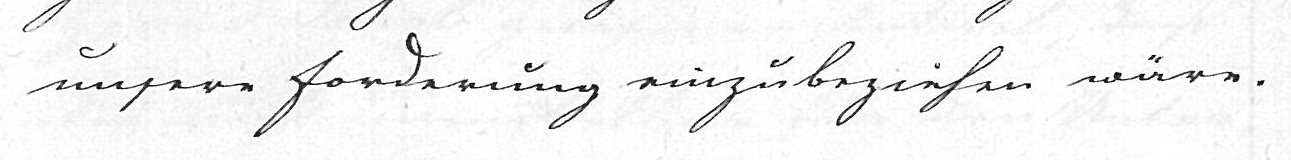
unsere Forderung einzubeziehen wäre.
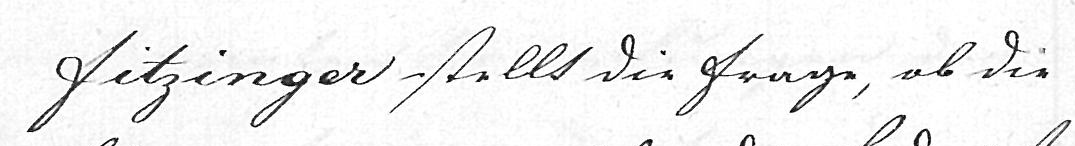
Fitzinger stellt die Frage, ob die
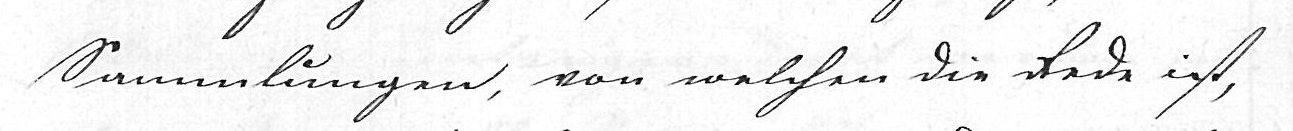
Sammlungen, von welchen die Rede ist,
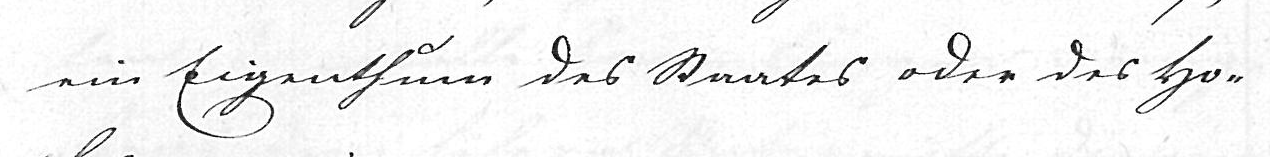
ein Eigenthum des Staates oder des Ho-
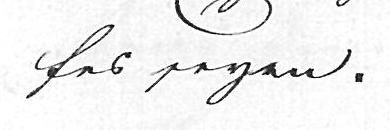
fes seyen.
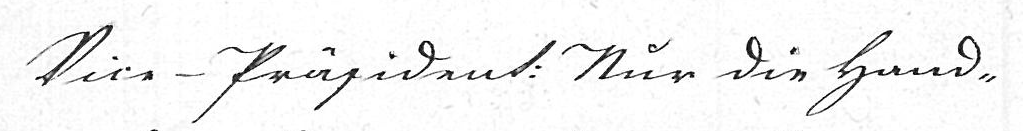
Vice-Präsident: Nur die Hand-
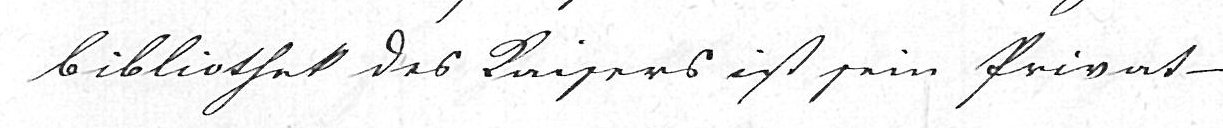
bibliothek des Kaisers ist sein Privat-
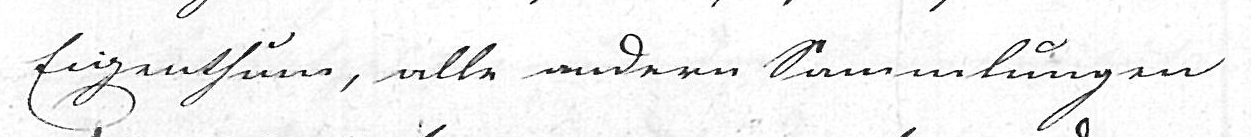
Eigenthum, alle andern Sammlungen
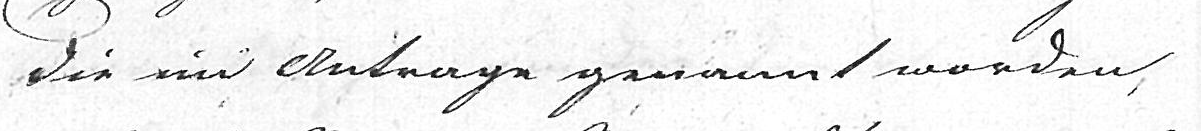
die im Antrage genannt worden,
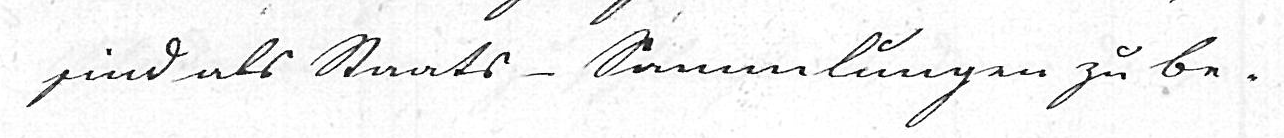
sind als Staats-Sammlungen zu be-
